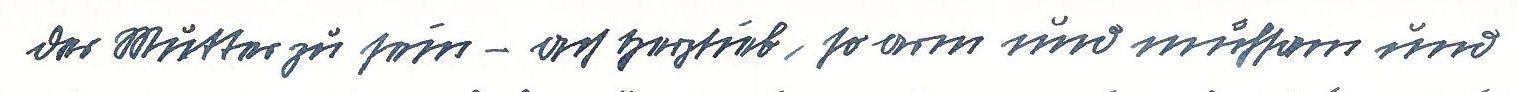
der Mutter zu sein – ach Herzlieb, so arm und mühsam und
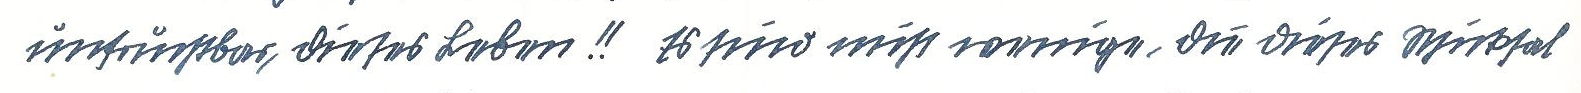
unfruchtbar, dieses Leben!! Es sind nicht wenige, die dieses Schicksal
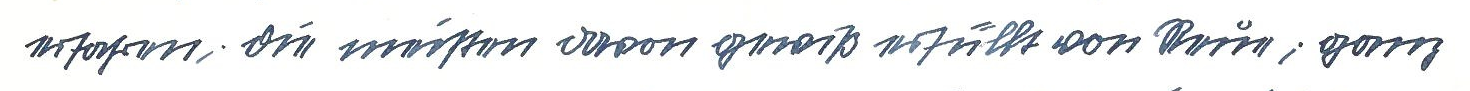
erfahren; die meisten davon gewiß erfüllt von Reue; ganz
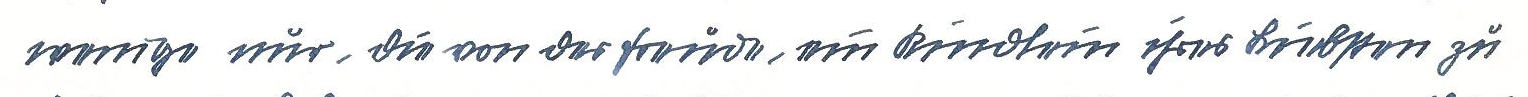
wenige nur, die von der Freude, ein Kindlein ihres Liebsten zu
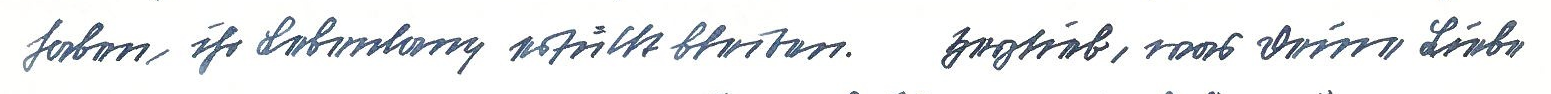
haben, ihr Lebenlang erfüllt bleiben. Herzlieb, was Deine Liebe
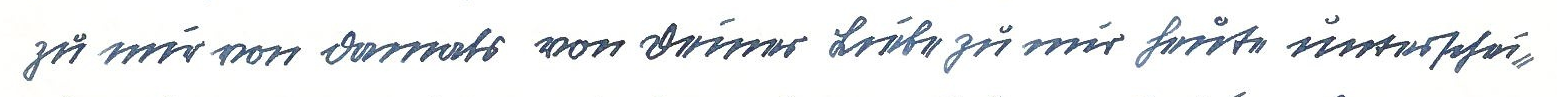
zu mir von damals von Deiner Liebe zu mir heute unterschei¬
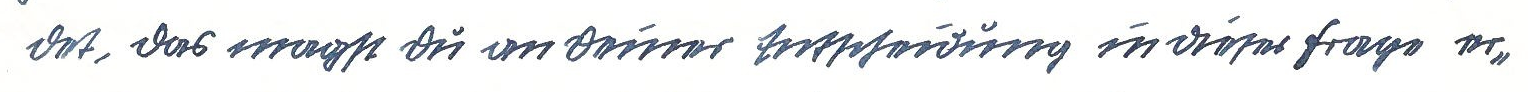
det, das magst Du an Deiner Entscheidung in dieser Frage er¬
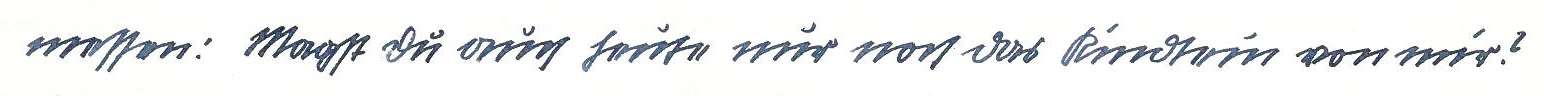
messen: Magst Du auch heute nur noch das Kindlein von mir?
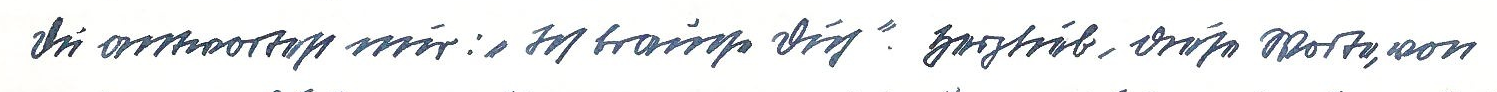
Du antwortest mir: „Ich brauche Dich“. Herzlieb, diese Worte, von
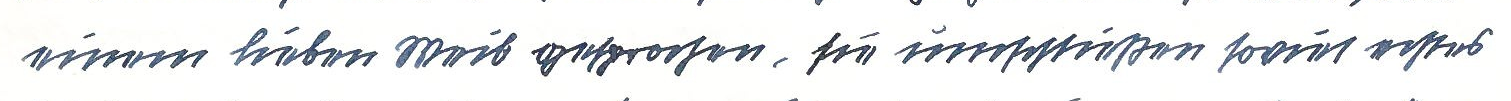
einem lieben Weib gesprochen, sie umschließen soviel echtes
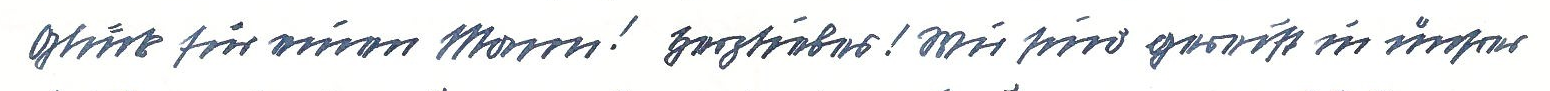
Glück für einen Mann! Herzliebes! Wir sind gereift in unsrer
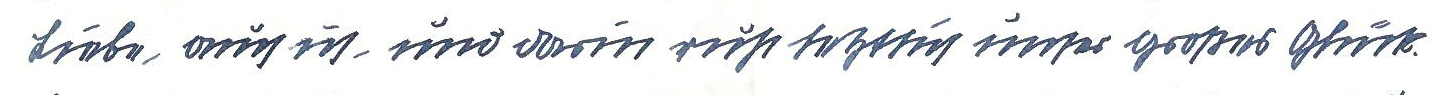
Liebe, auch ich, und darin ruht letztlich unser großes Glück.
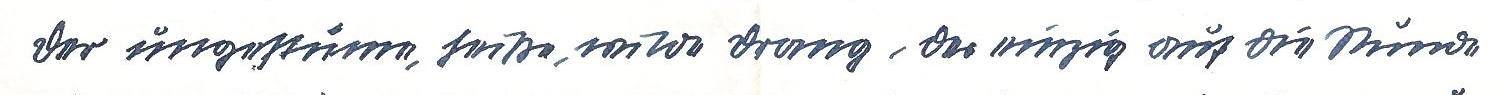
Der ungestüme, heiße, wilde Drang, der einzig auf die Stunde
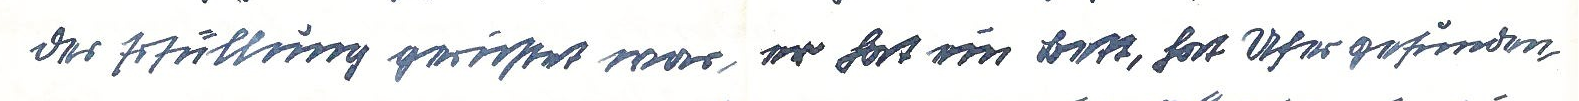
der Erfüllung gerichtet war, er hat ein Bett, hat Ufer gefunden,
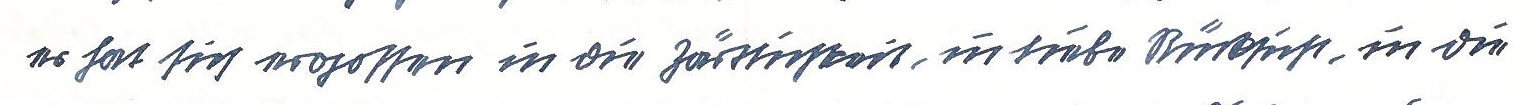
er hat sich ergossen in die Zärtlichkeit, in liebe Rücksicht, in die
